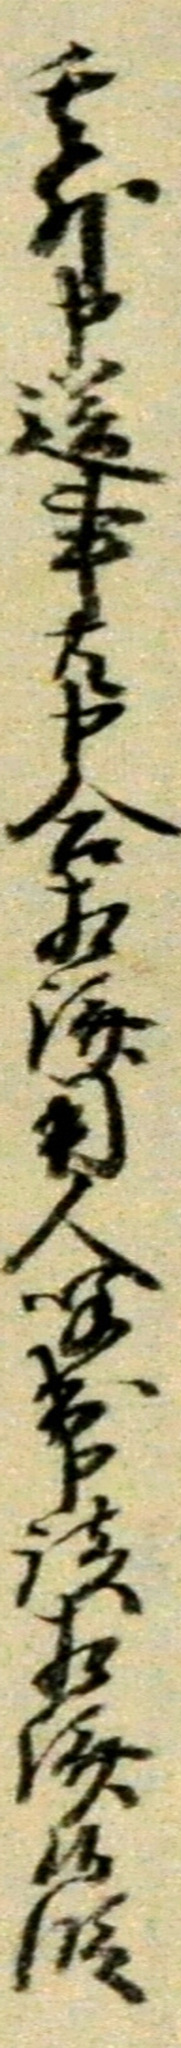其外申送事共申合相済用人呼出申談相済候段
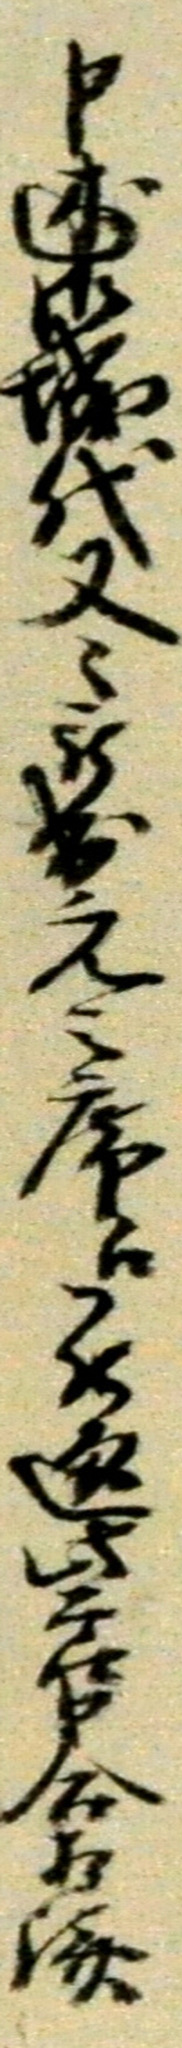申述御城代又々被出元之席江罷通此節申合相済
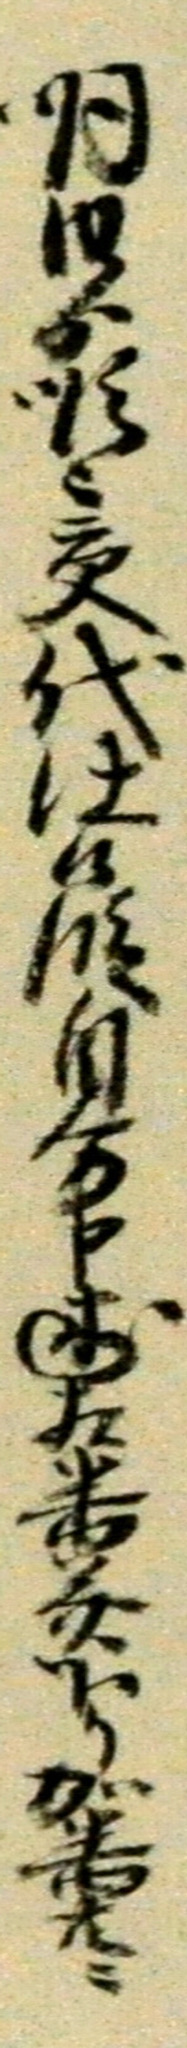明日ゟ順ニ交代仕候段自分申述相番幷下り加番共二
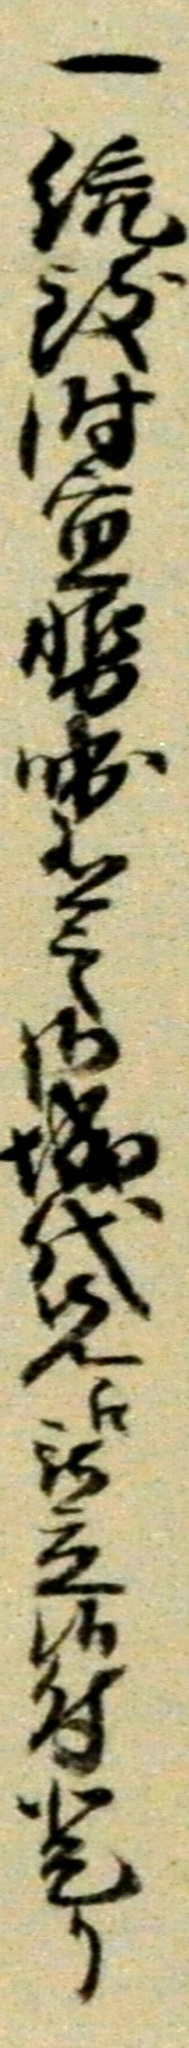一統致時宜暫咄有之御城代先江被立候付登り
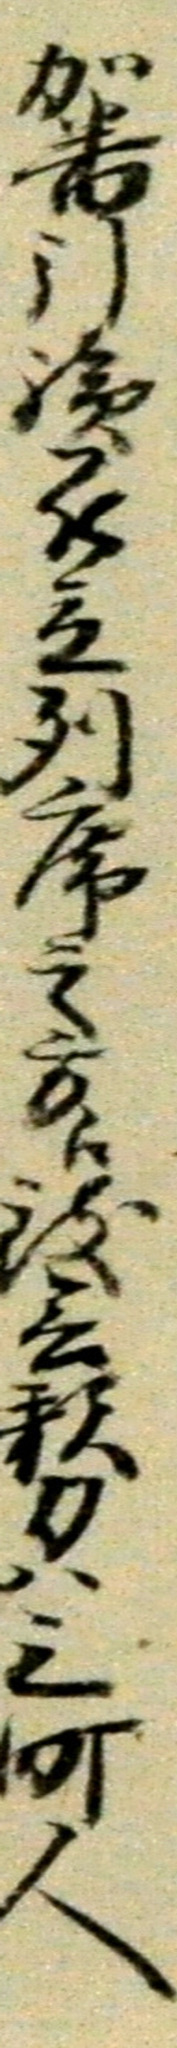加番引續罷立列席之方江致会釈刀ㇵ三町人

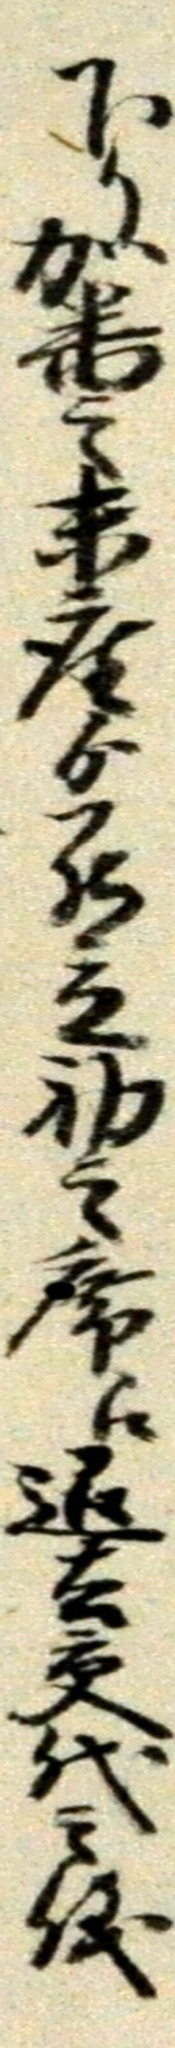下り加番之末座ゟ罷立初之席江退去交代之儀
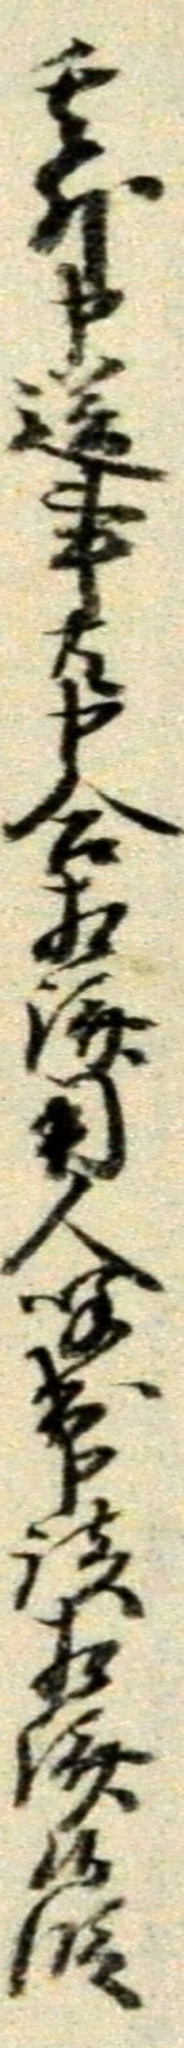其外申送事共申合相済用人呼出申談相済候段
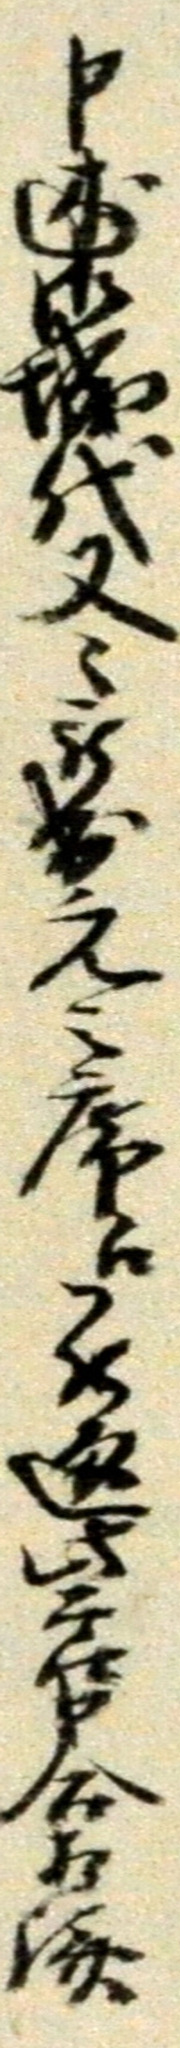申述御城代又々被出元之席江罷通此節申合相済
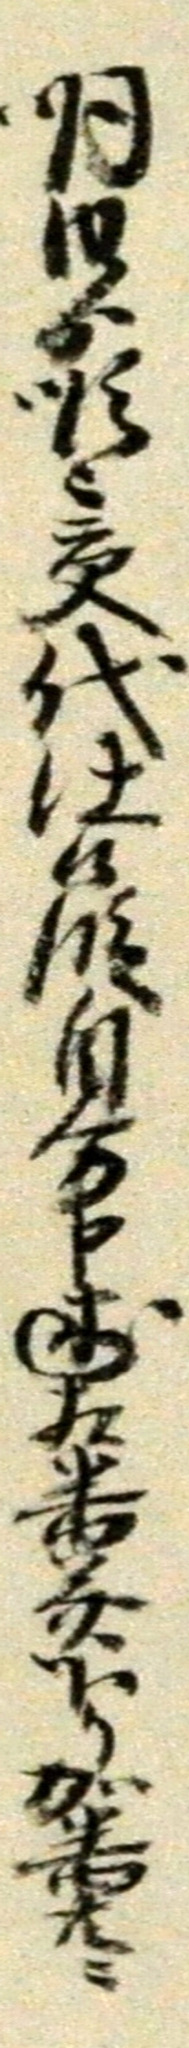明日ゟ順々交代仕候段自分申述相番幷下り加番共二
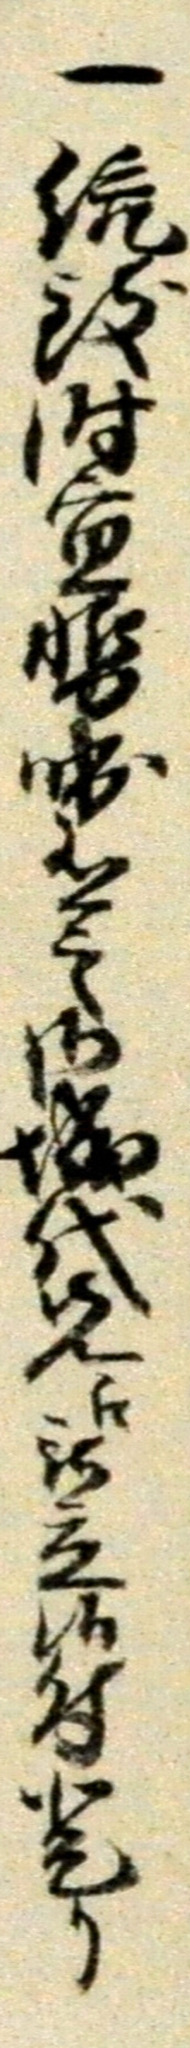一統致時宜暫咄有之御城代先江被立候付登り
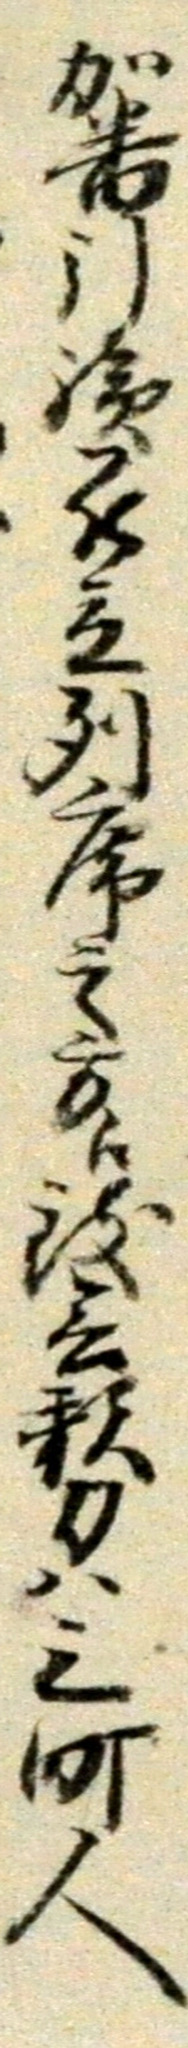加番引續罷立列席之方江致会釈刀ㇵ三町人
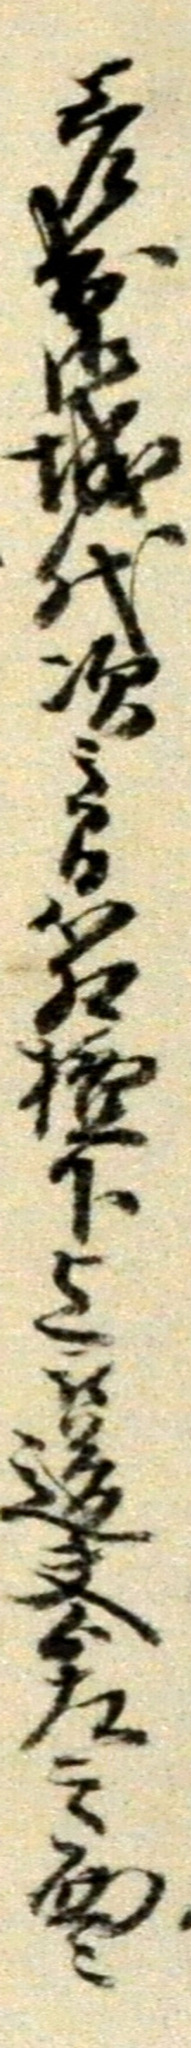差出御城代次之箱檀下迄被送夫ゟ左之面々
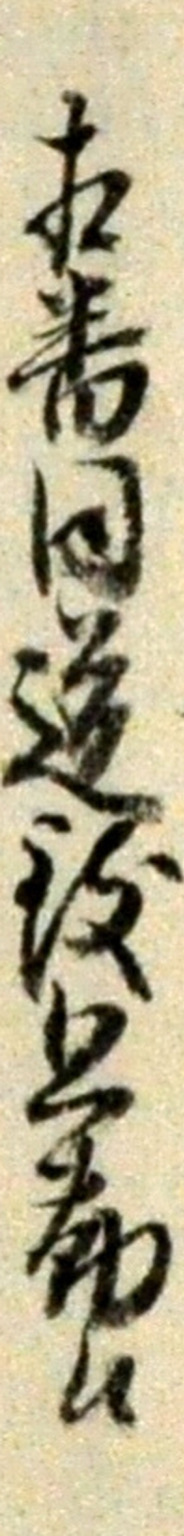相番同道致廻勤候
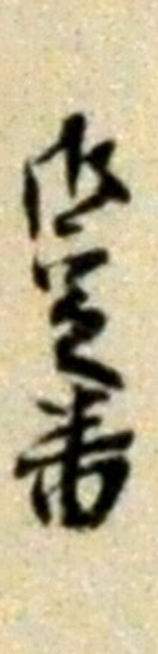御定番
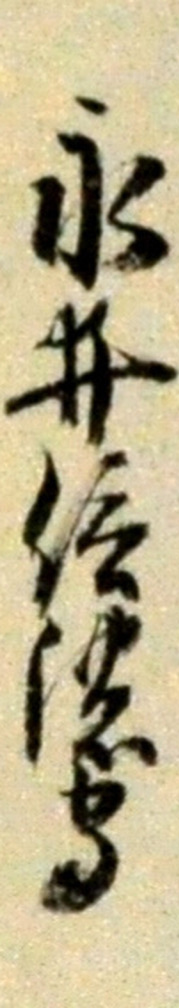永井信濃守
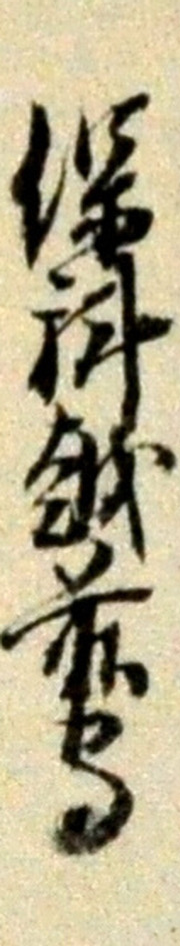保科越前守
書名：大阪加番関係諸書留〔一括〕
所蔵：伊那市立高遠町図書館・合同会社AMANE
